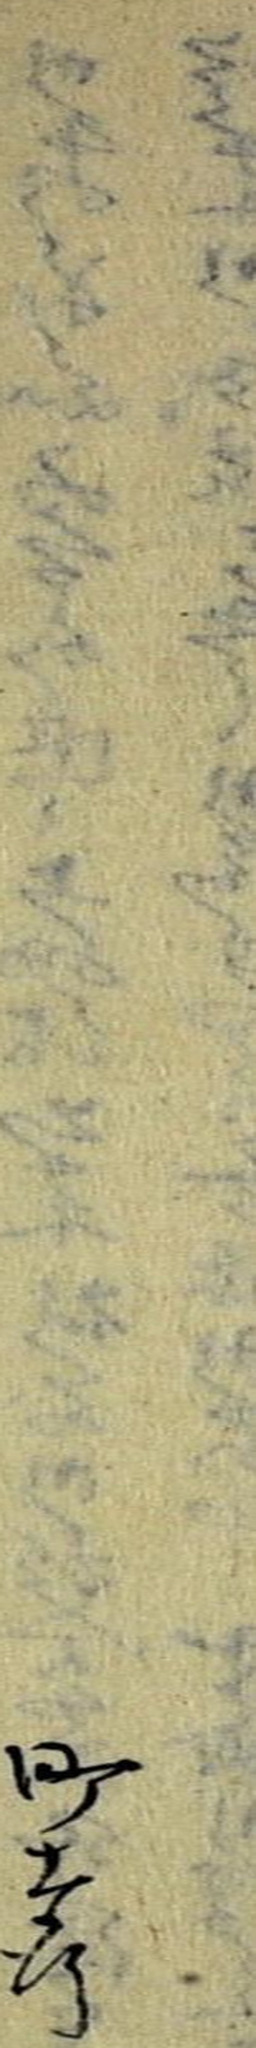町奉行
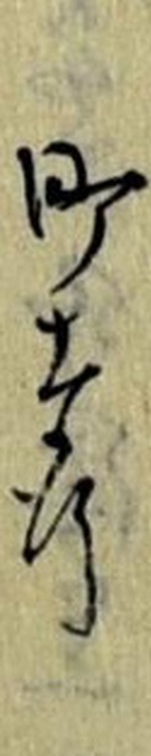町奉行
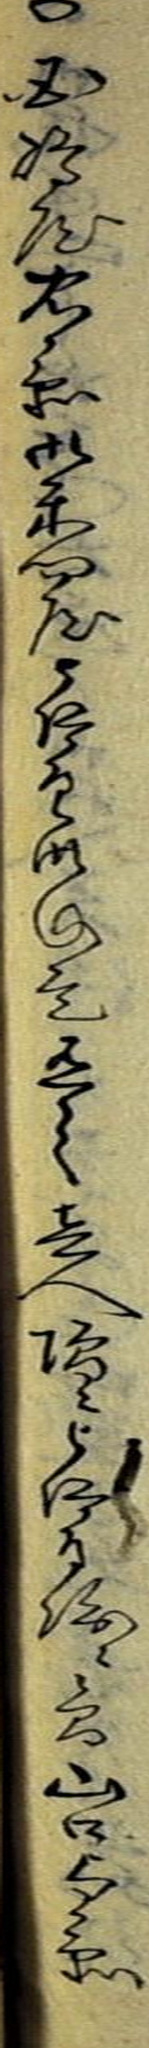○国嶋屋忠兵衛御米問屋被仰付候御趣意有之壱人増に被仰付儀に候間山口与兵衛
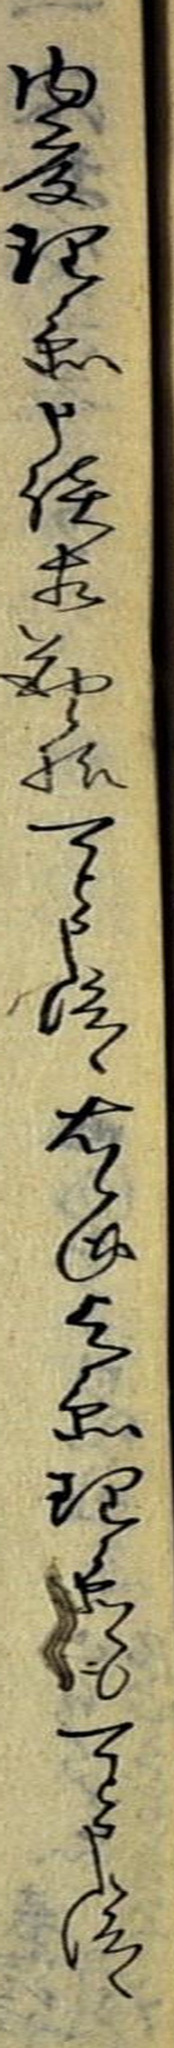内藤理兵衛申談相勤候様可被申渡候右之趣与兵衛理兵衛へも可被申渡候
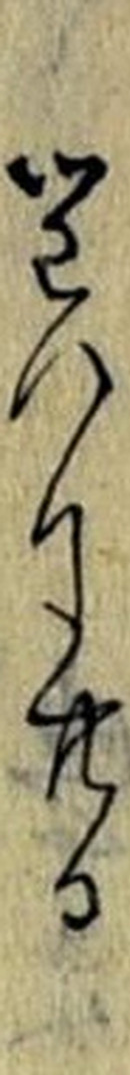閏八月廿日
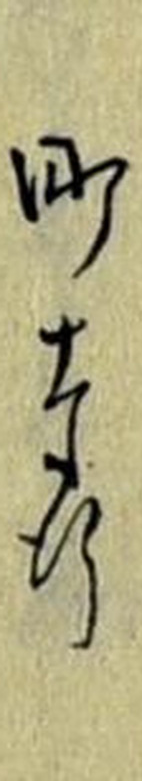町奉行
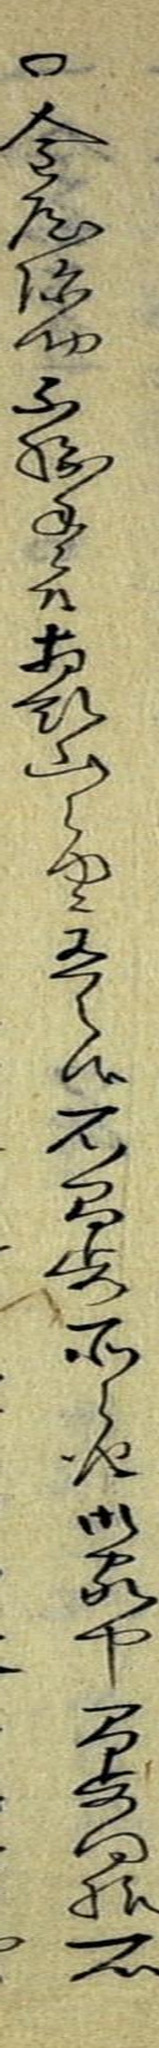○金屋弥助不勝手に付拝領山之内に有之候石間歩所之儀御家中間歩同様石
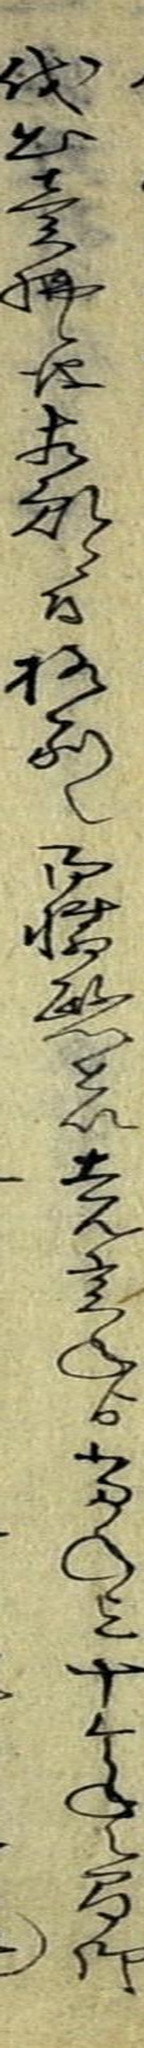伐出売払候儀相願候に付各別之御憐愍を以去亥年ゟ当年迄十ヶ年之間御
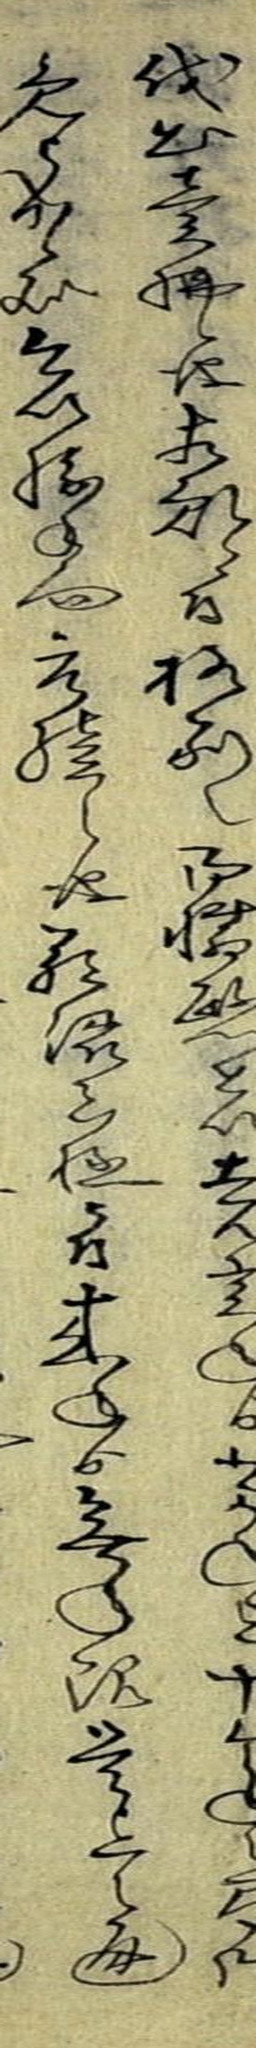免被成候処今以勝手向取続候儀難渋至極に付来年ゟ壱年限是迄之通
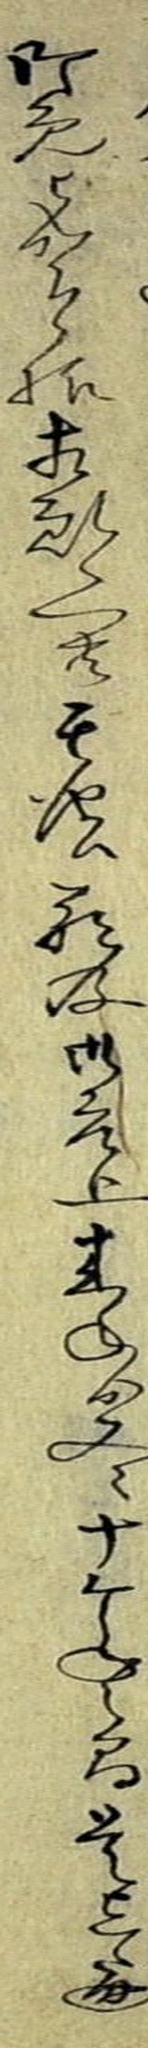御免被成下候様相願候へ共其儀は難及御取上来年ゟ又々十ヶ年之間是迄之通
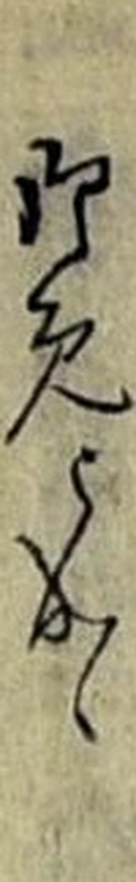御免被成候
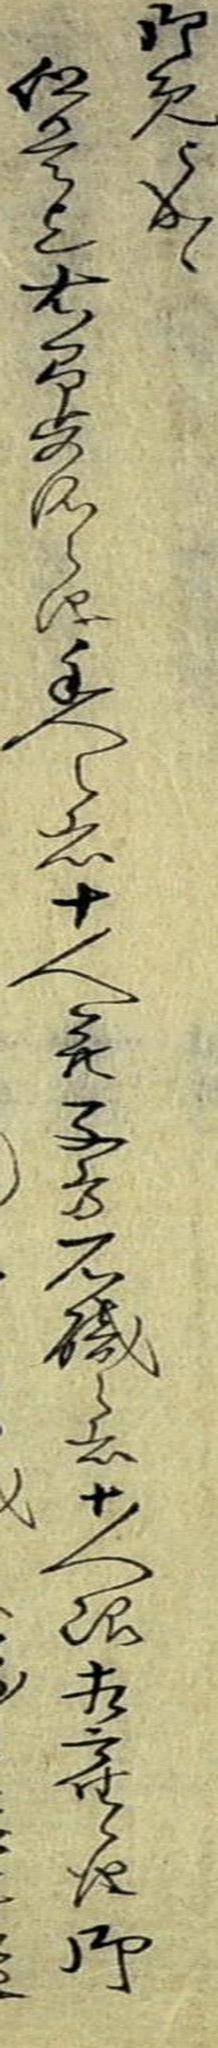但是迄右間歩所之儀手人之者十人并子方石職之者十人限相雇候儀御
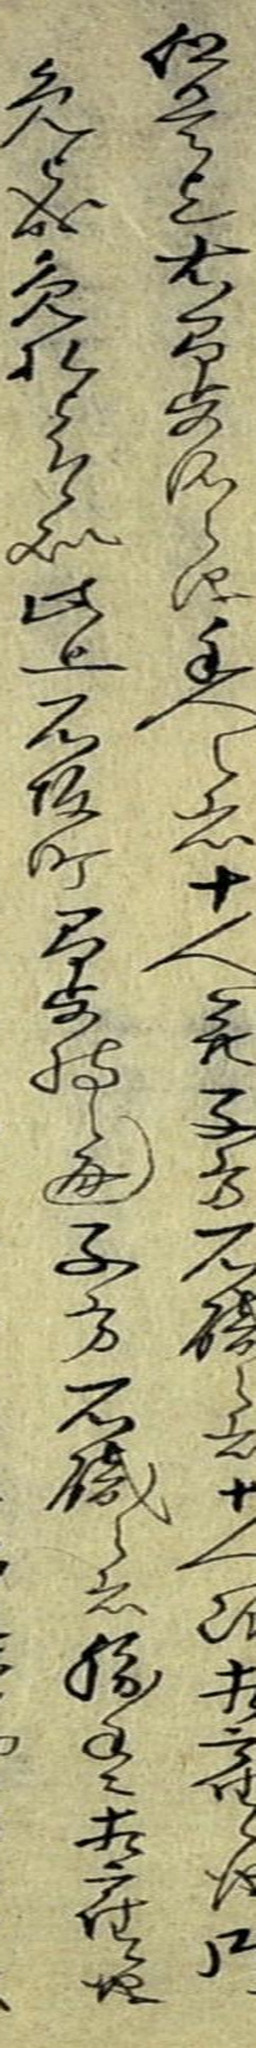免被成免札被下候処此上石坂町間歩持之通子方石職之者勝手に相雇候儀
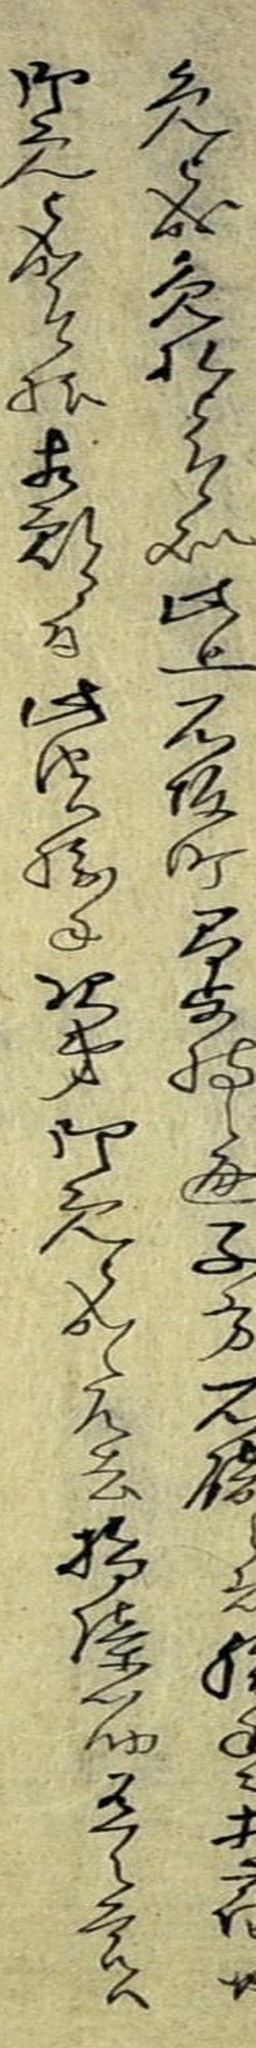御免被成下候様相願候に付此儀は勝手次第御免被成候乍去指障筋有之節は
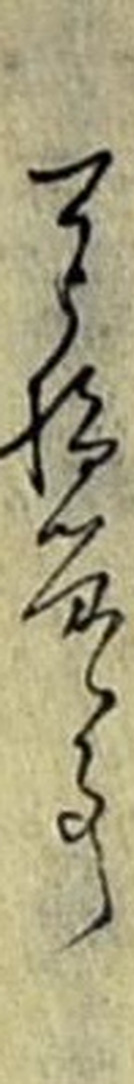可被指留候事
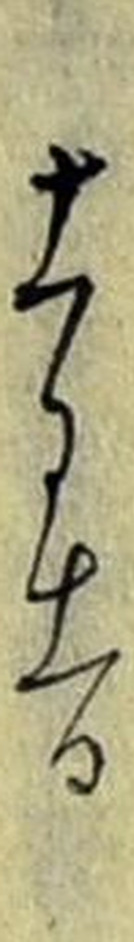十一月十一日
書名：命令之部 四
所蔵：福井県文書館 Fukui Prefectural Archives
